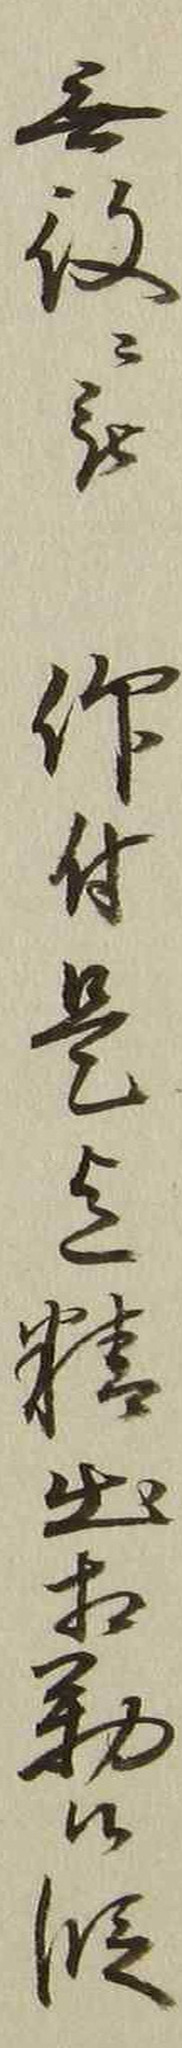無役に被仰付是迄精出相勤候段
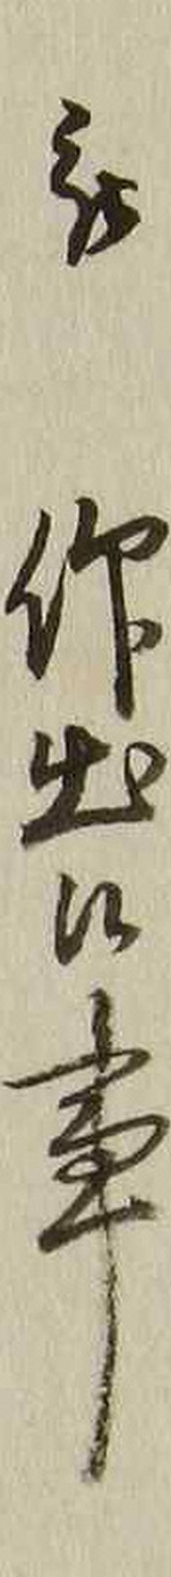被仰出候事
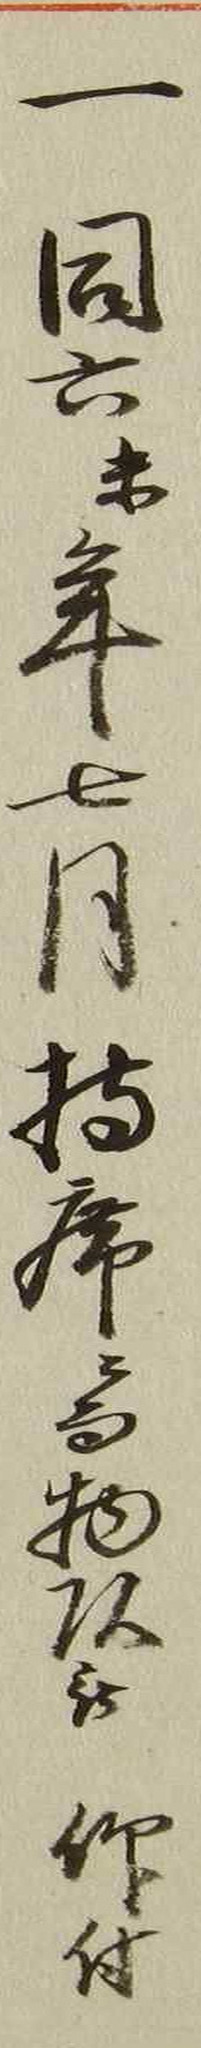一同六未年七月持席に而物頭被仰付
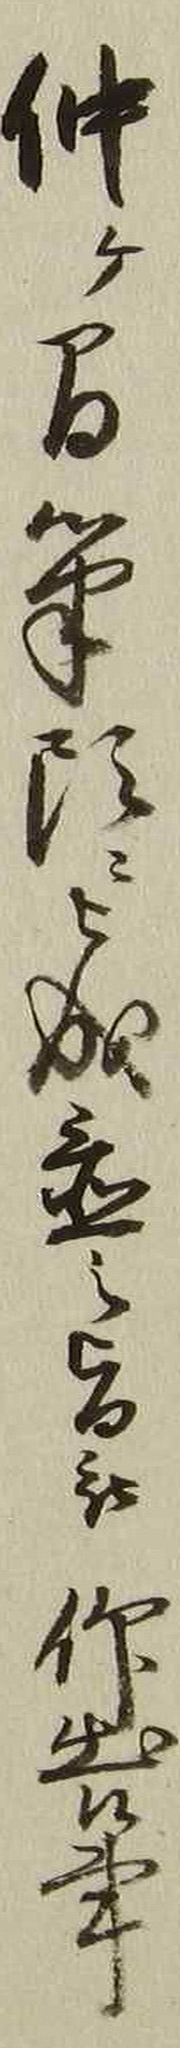仲ケ間筆頭に被成置之旨被仰出候事
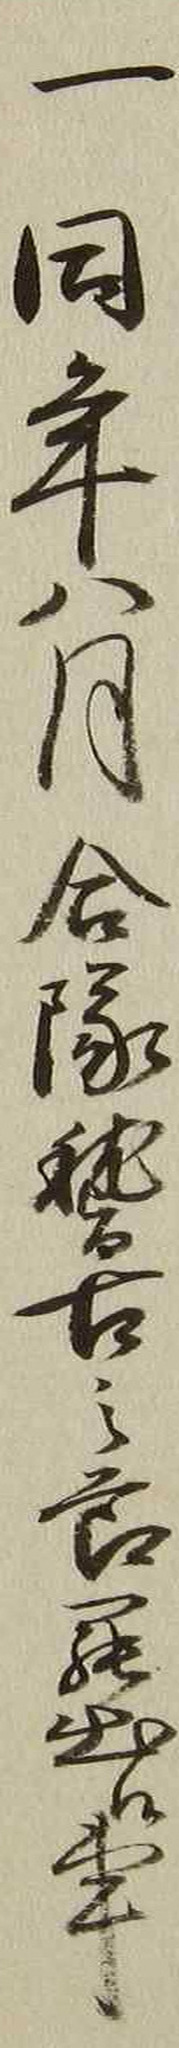一同年八月合隊稽古之節罷出候事
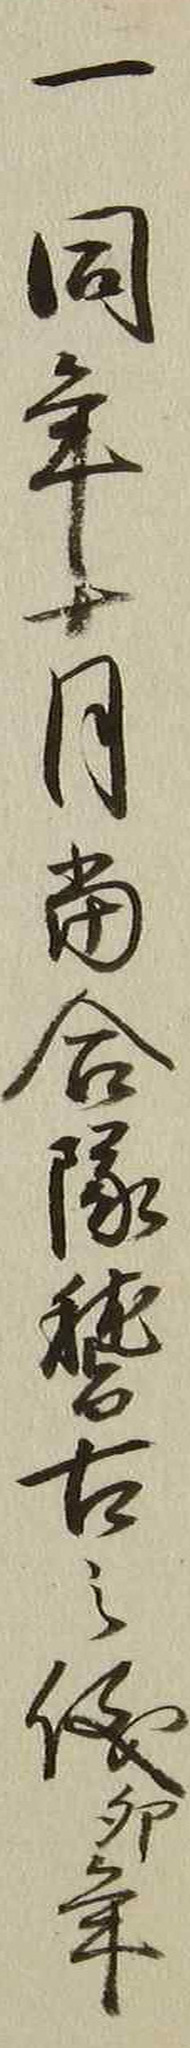一同年十月当合隊稽古之儀卯年
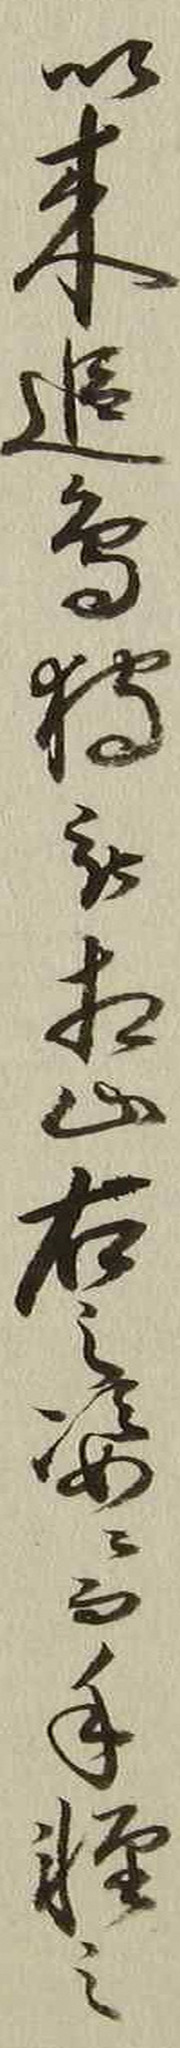以来追鳥狩被相止右之姿に而手軽之
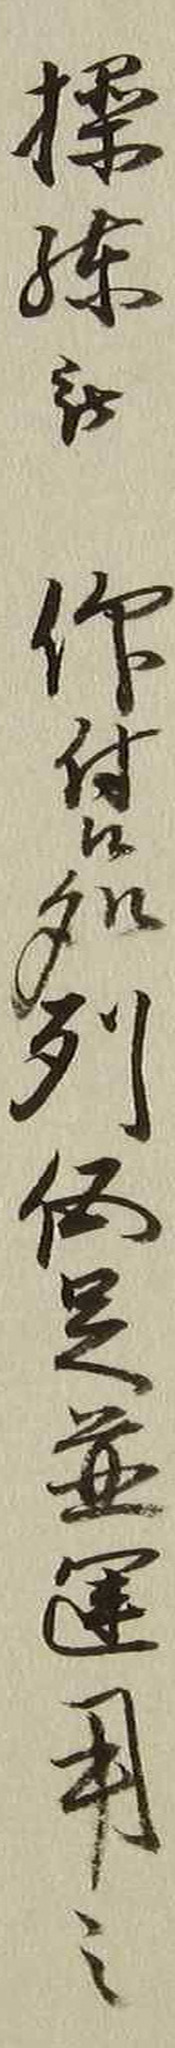操練被仰付候処列伍足並運用之
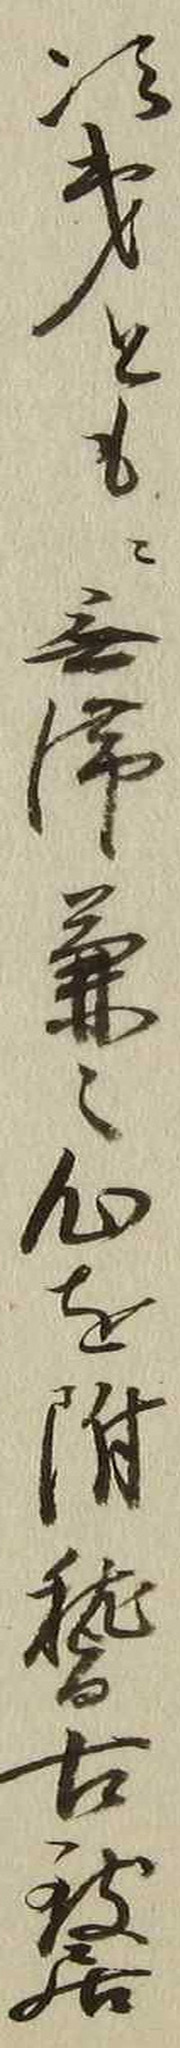次第ともに無滞兼々心を附稽古致居
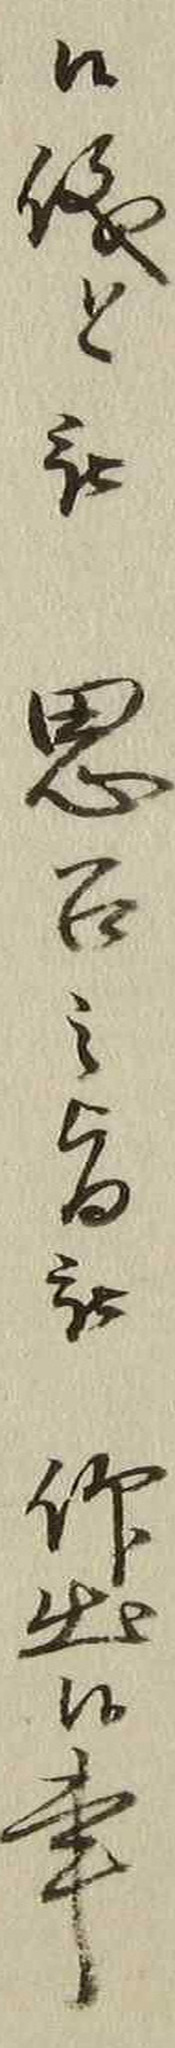候儀と被思召之旨被仰出候事
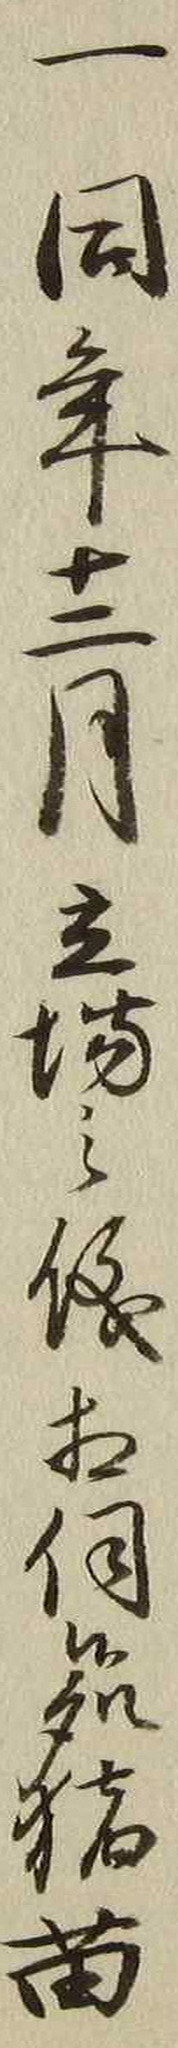一同年十二月立場之儀相伺候処猪苗
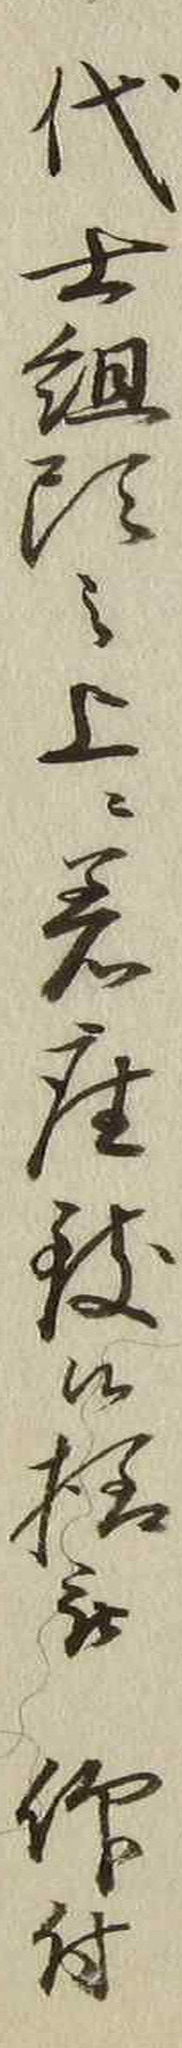代士組頭之上に着座致候様被仰付
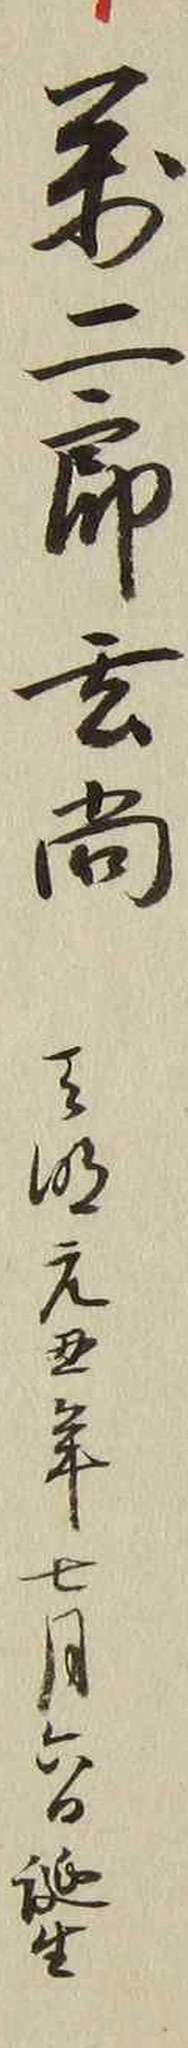万二郎玄尚天明元丑年七月六日誕生
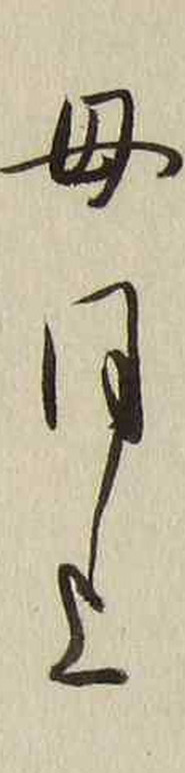母同上
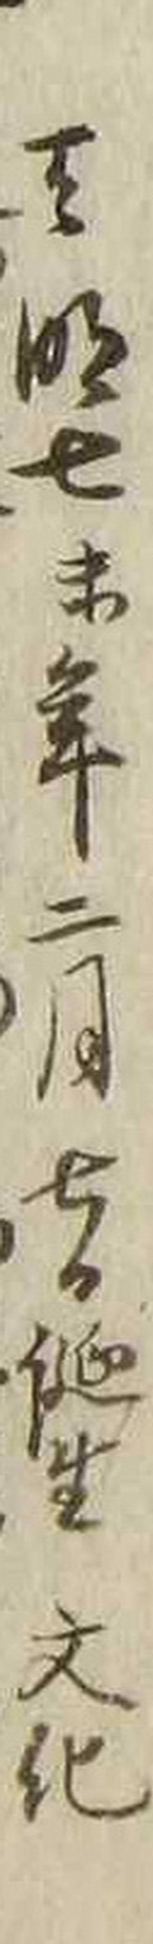天明七末年二月る七日誕生文化
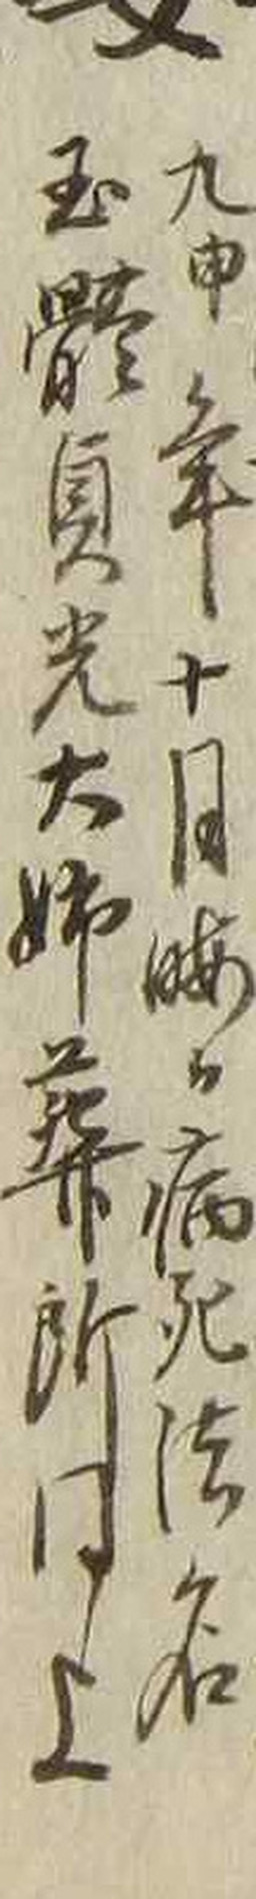玉体貞光大姉葬所同上
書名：諸士系譜　巻之133　た之部9
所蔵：会津若松市立会津図書館
